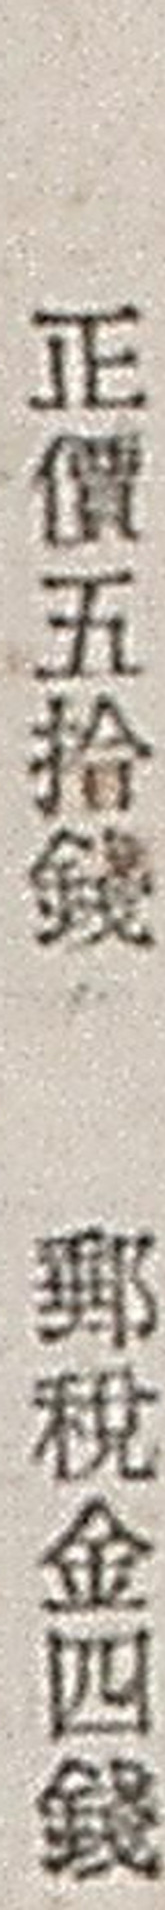正価五拾銭郵税金四銭
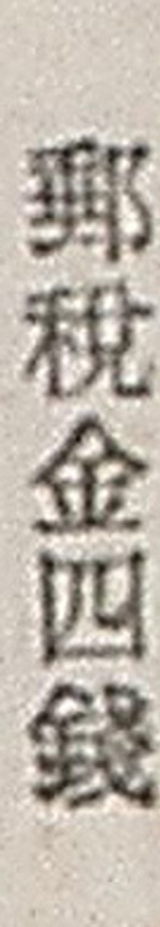郵税金四銭
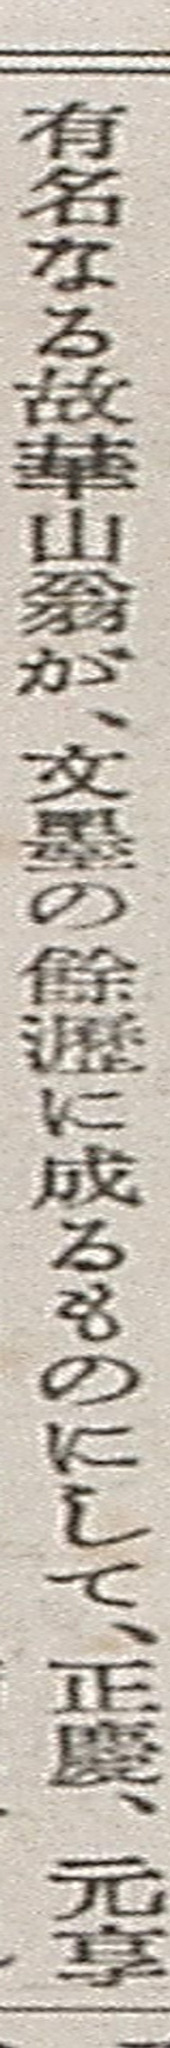有名なる故華山翁が、文墨の余瀝に成るものにして、正慶、元享
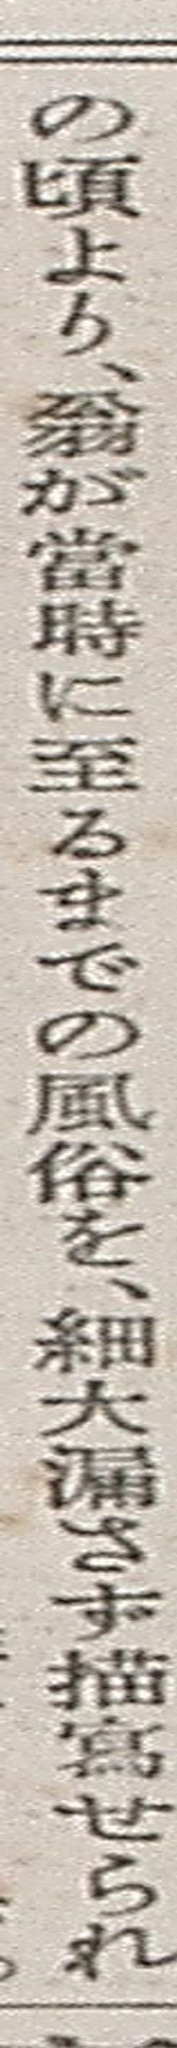の頃より、翁が当時に至るまでの風俗を、細大漏さず描写せられ
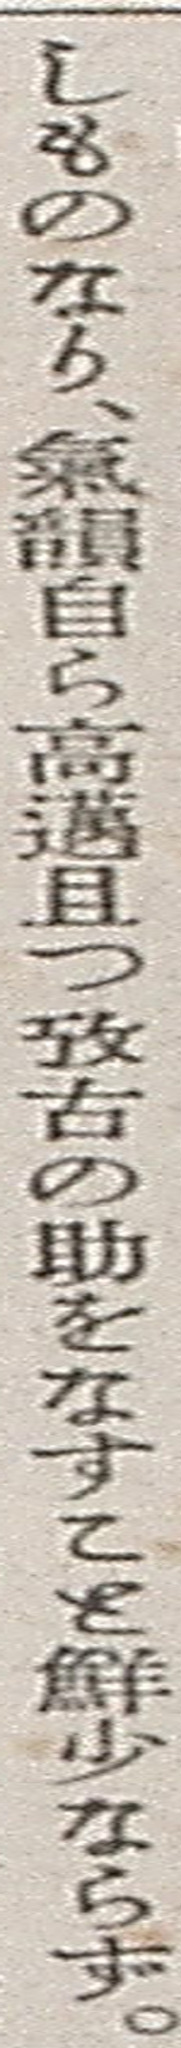しものなり、気韻自ら高邁且つ攷古の助をなすことを鮮少ならず。
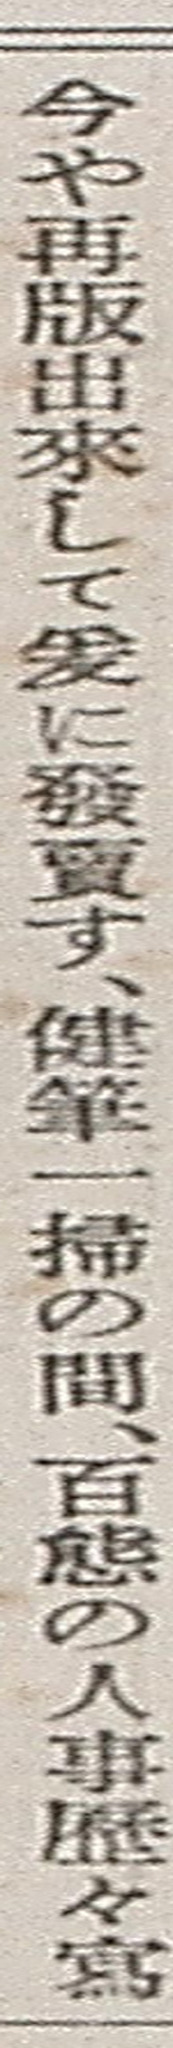今や再版出来して爰に発売す、健筆一掃の間、百態の人事歴々写
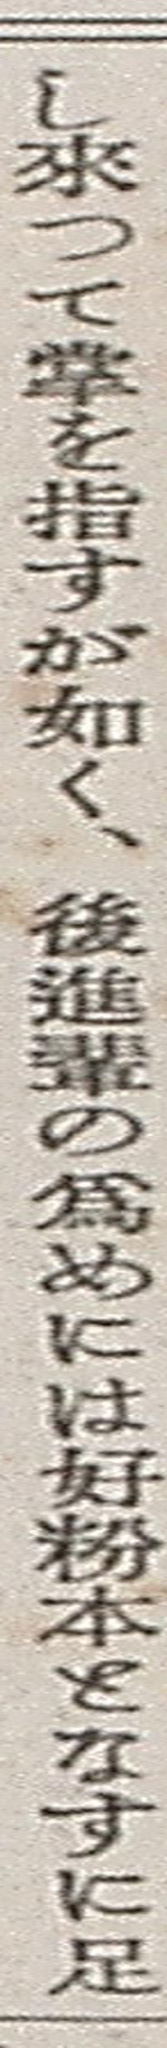し来つて掌を指すが如く、後進輩の為めには好粉本となすに足
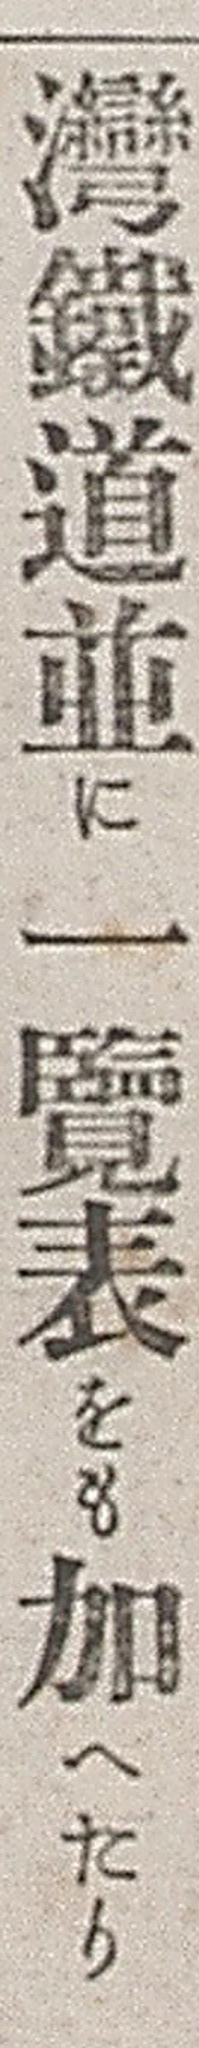湾鉄道並に一覧表をも加へたり
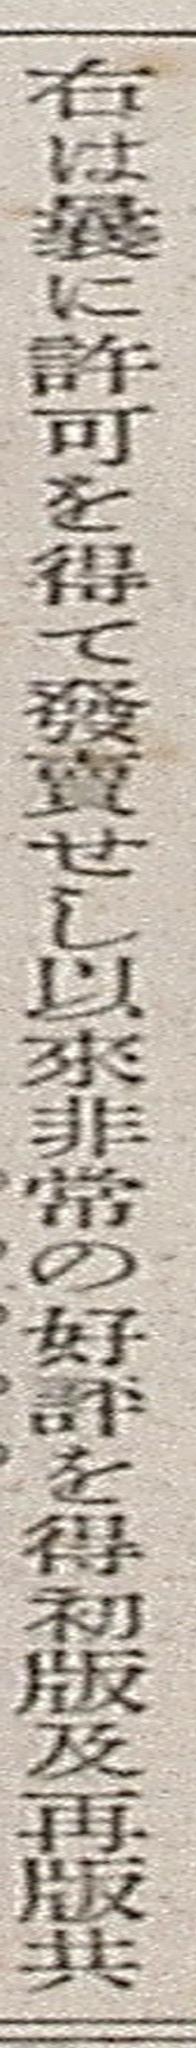右は曩に許可を得て発売せし以来非常の好評を得初版及
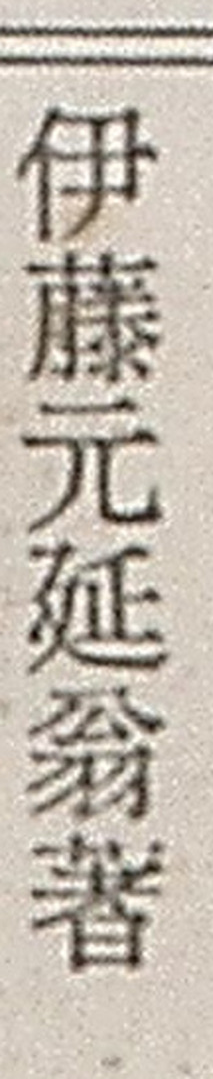伊藤元延翁著
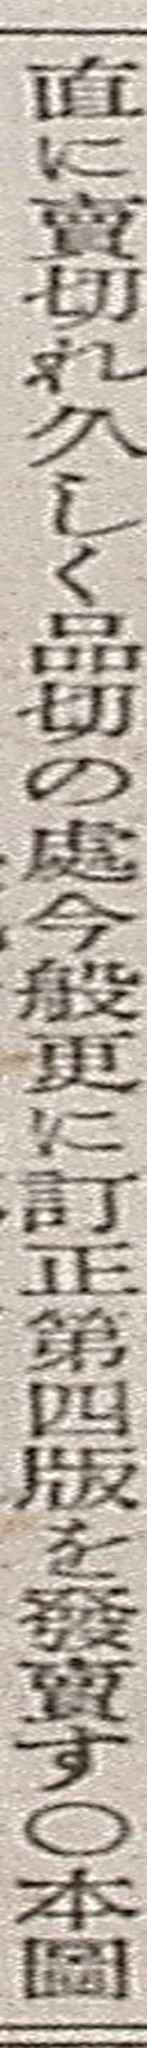直に売切れ久しく品切の處今般更に訂正第四版を発売す○本図
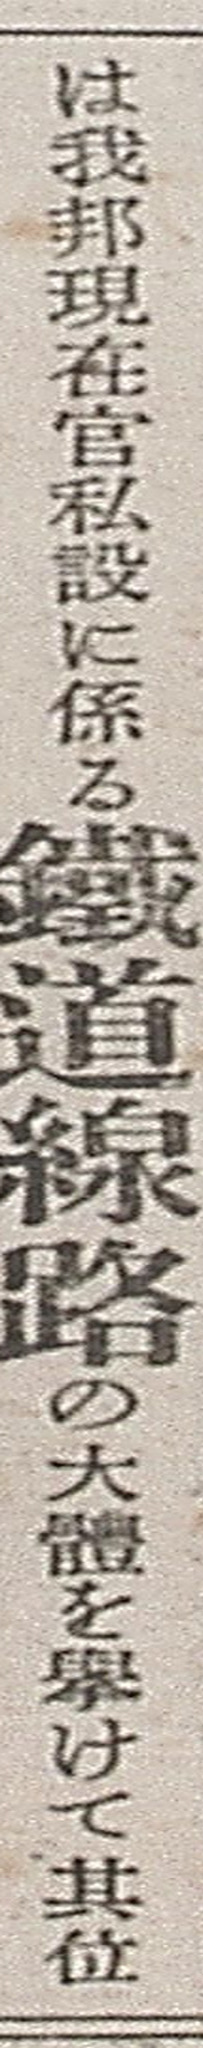は我邦現在官私設に係る鉄道線路の大体を挙けて其位
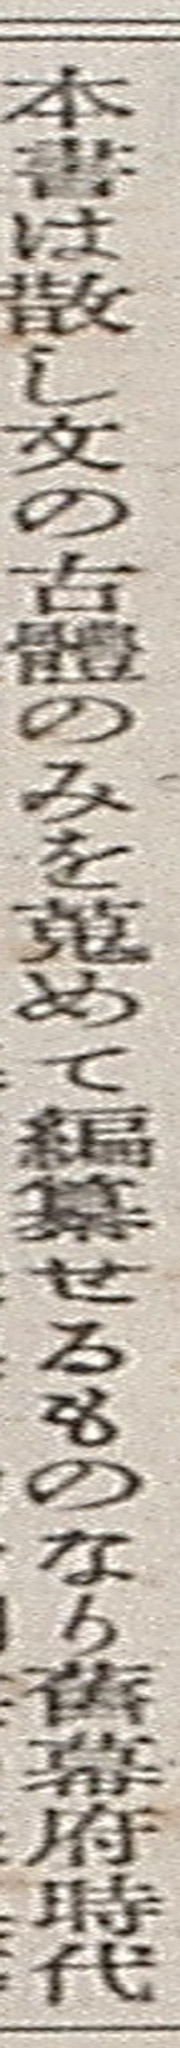本書は散し文の古体のみを蒐めて編纂せるものなり旧幕府時代
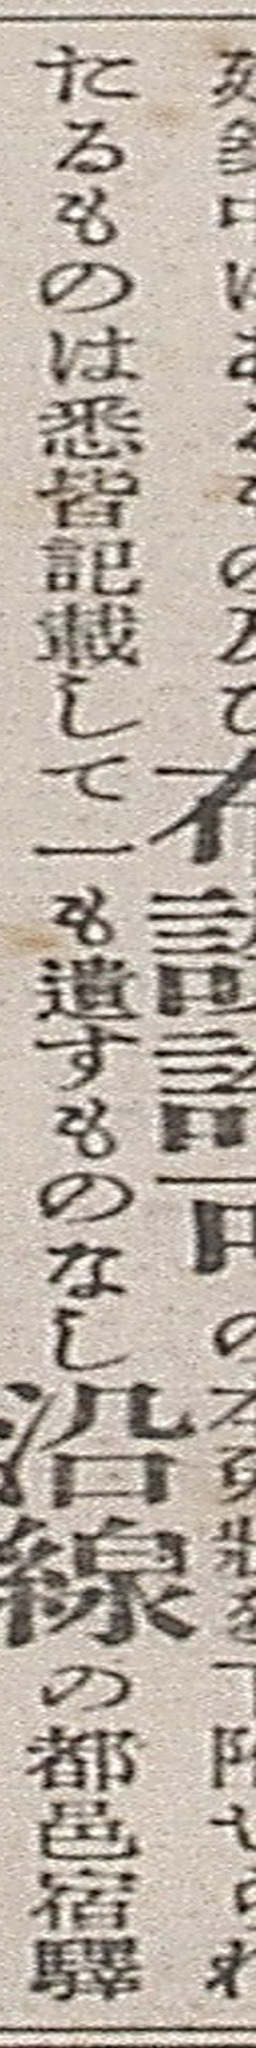たるものは悉皆記載して一も遺すものなし沿線の都邑宿駅
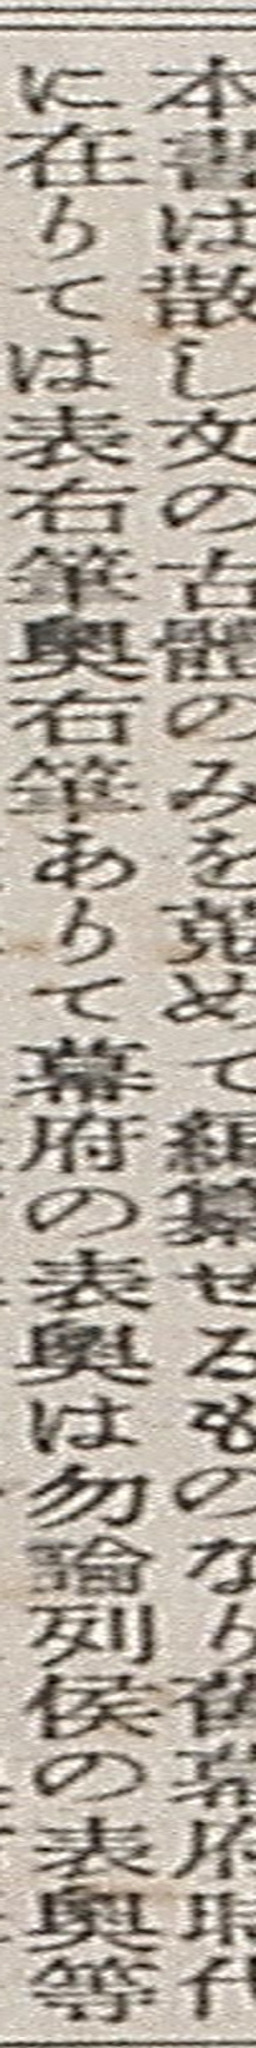に在りては表右筆奥右筆ありて幕府の表奥は勿論列侯の表奥等
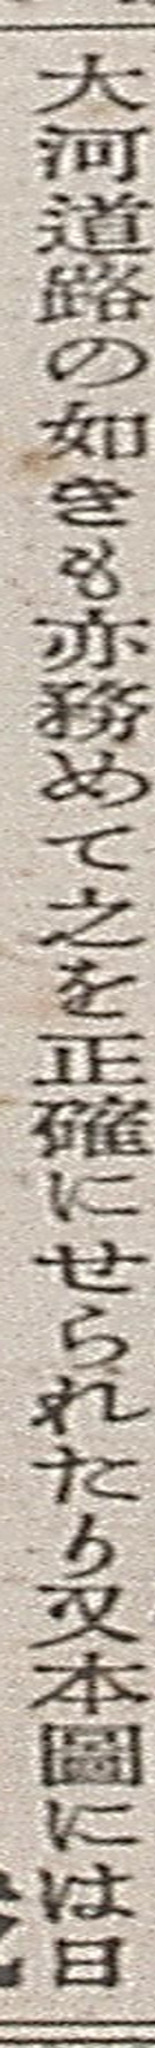大河道路の如きも亦務めて之を正確にせられたり又本図には日
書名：風俗畫報臨時増刊第百九十九號　明治三十二年十月各地災害圖會（前編之續）
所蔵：東京大学地震研究所図書室 Earthquake Research Institute Library, The University of Tokyo, JAPAN
